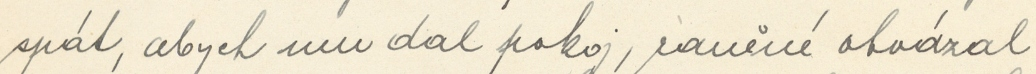spát, abych mu dal pokoj, raněné obvázal
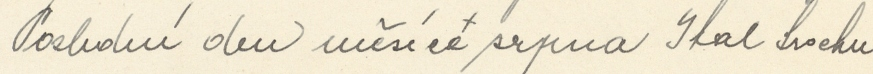Poslední den měsíce srpna Ital trochu
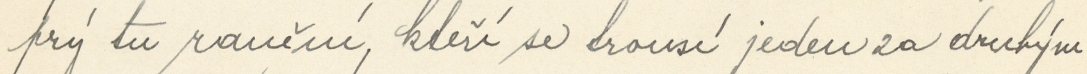prý tu ranění, kteří se trousí jeden za druhým.
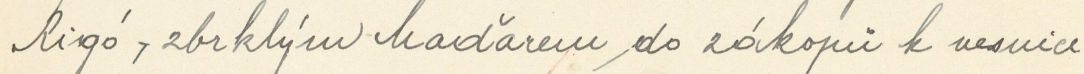Rigó, zbrklým Maďarem do zákopů k vesnici
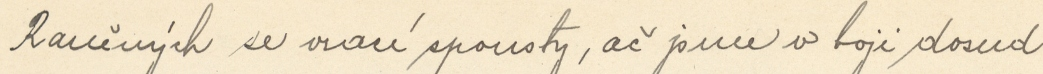Raněných se vrací spousty, ač jsme v boji dosud
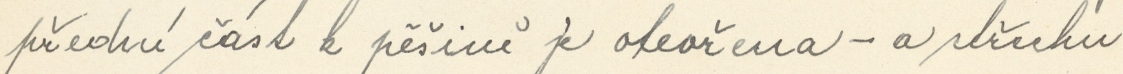přední část k pěšině je otevřena - a střechu
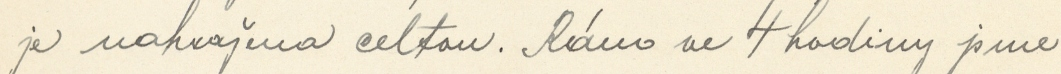je nahražena celtou. Ráno ve 4 hodiny jsme
